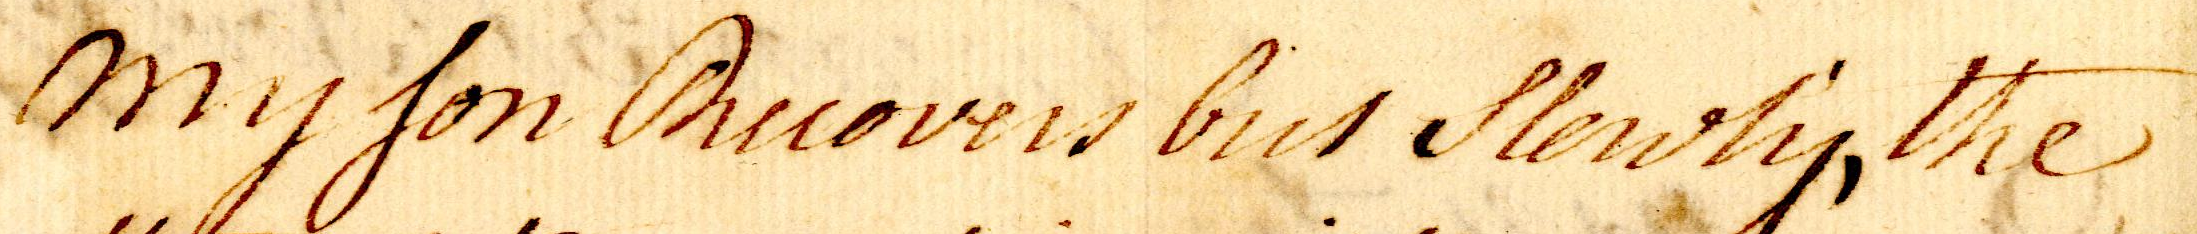My son Recovers but Slowly, the
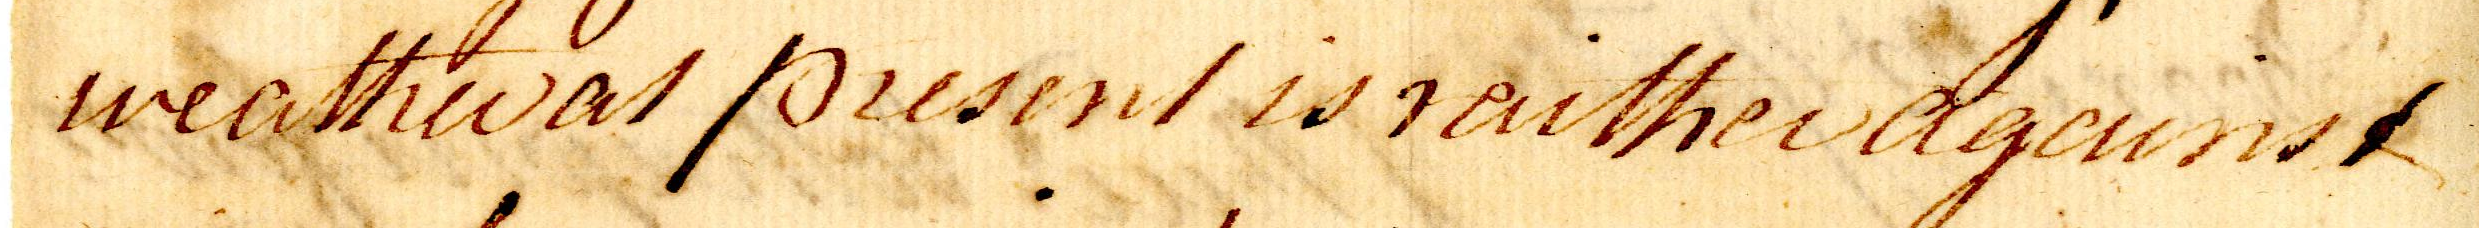weather at present is rather against
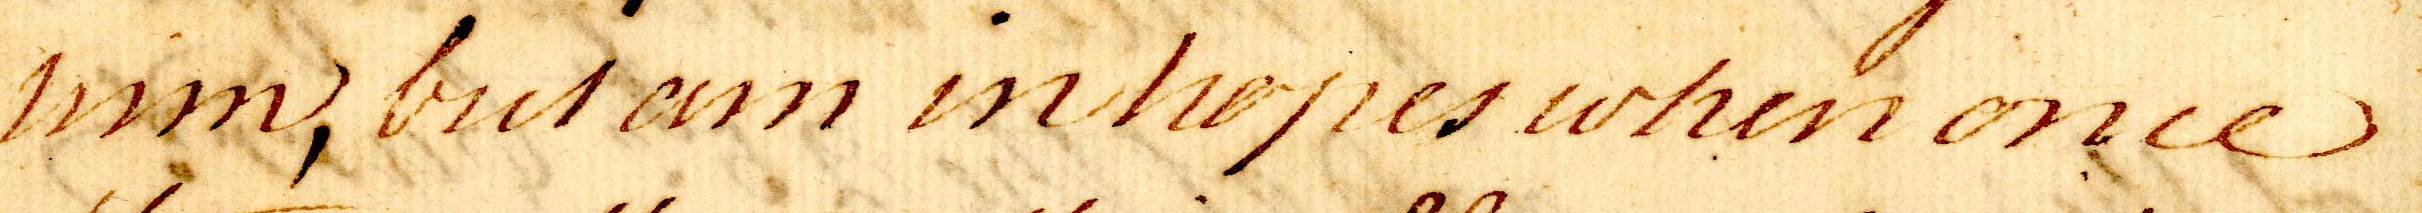him, but am in hopes when once
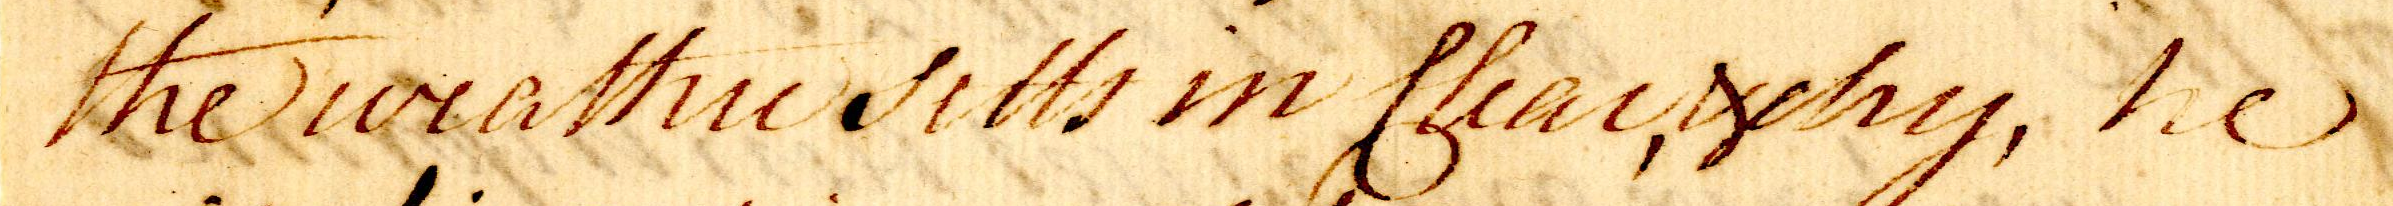the weather setts in Clear, & dry, he
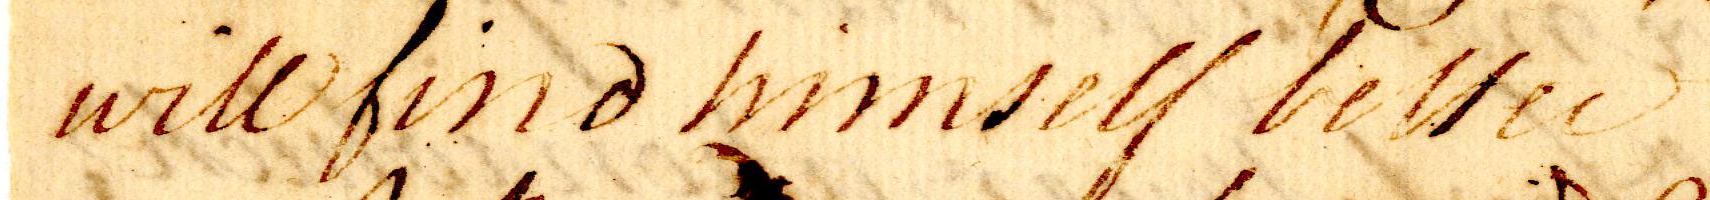will find himself better
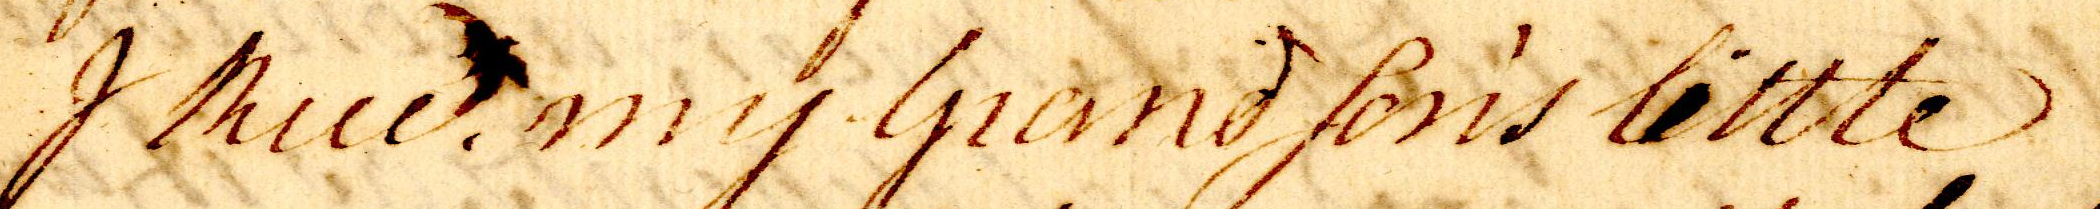I Rece^d. my Grand Son's little
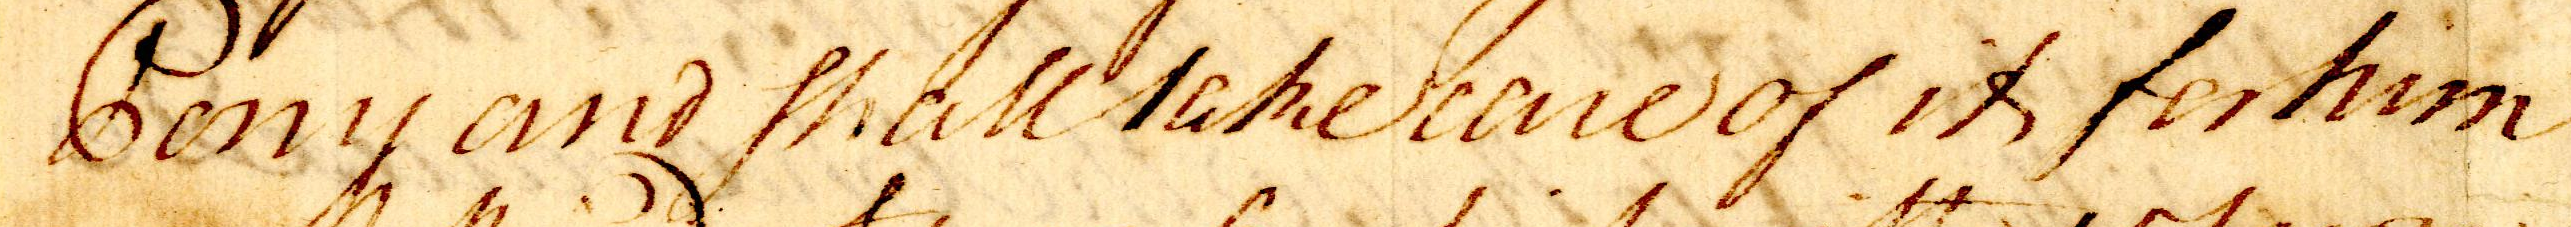Pony and shall take care of it for him
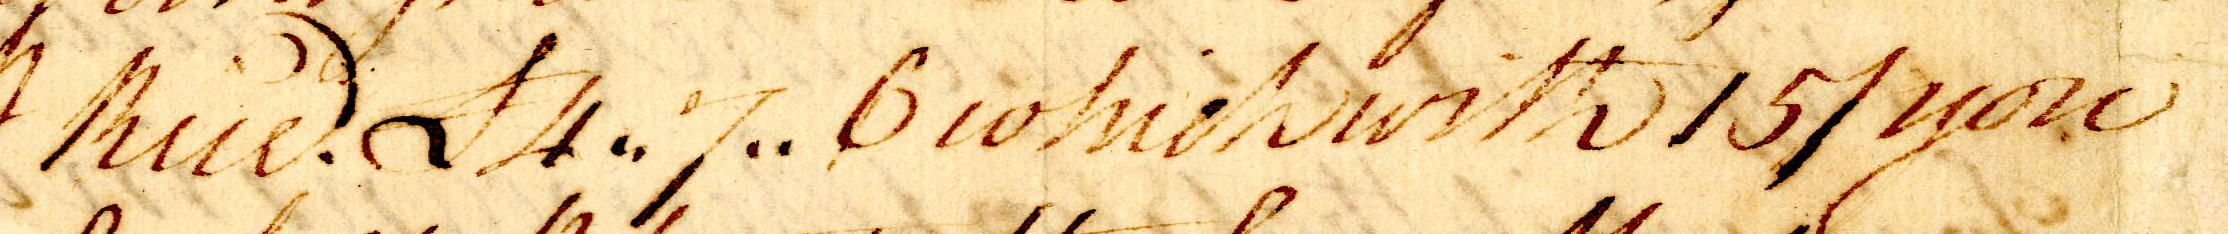I Rece^d £4..s..6 which with 15s you
